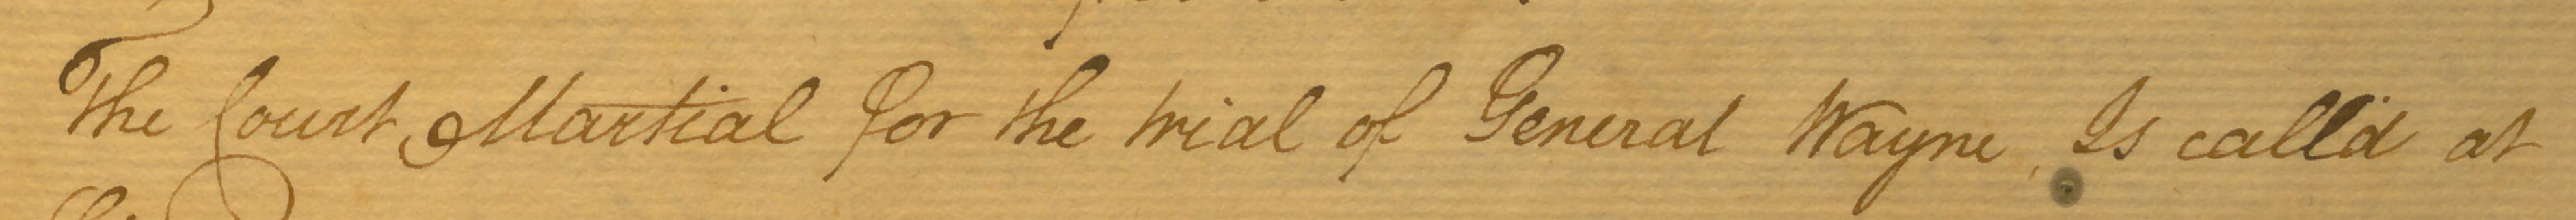The Court Martial for the trial of General Wayne Is calld at
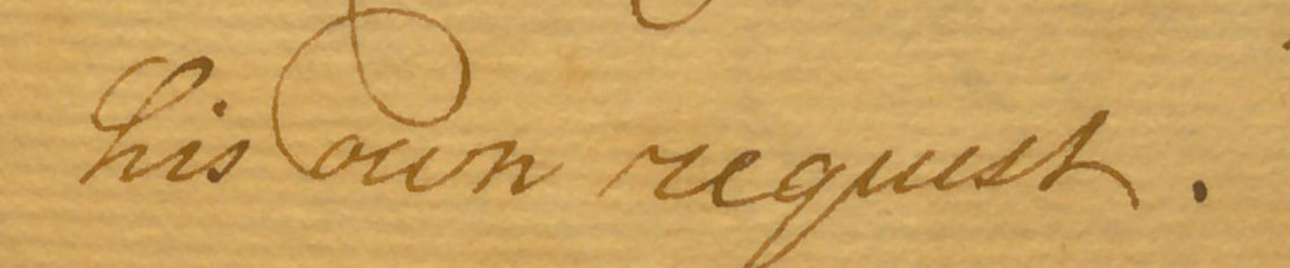his own request.
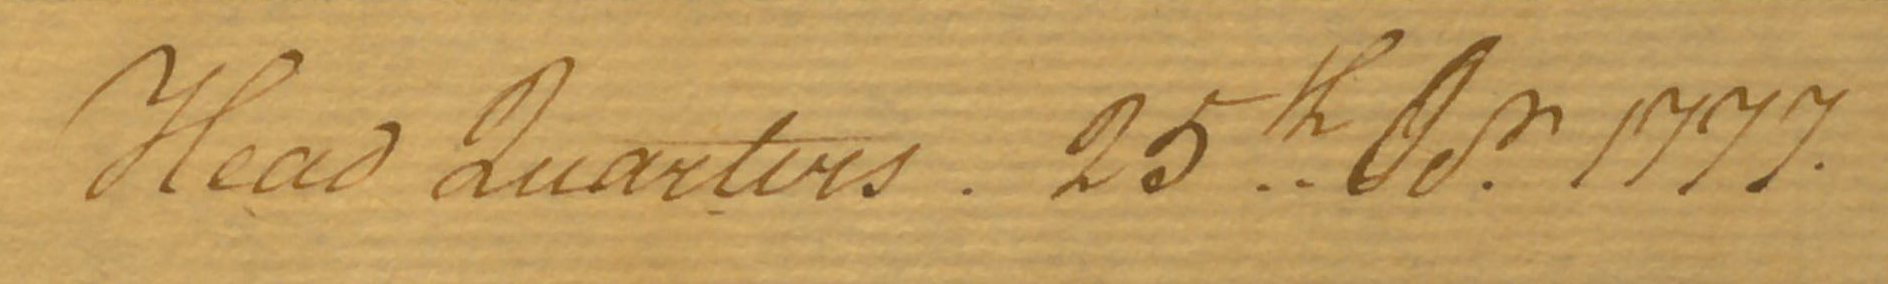Head Quarters. 25^th. Oc^r. 1777.
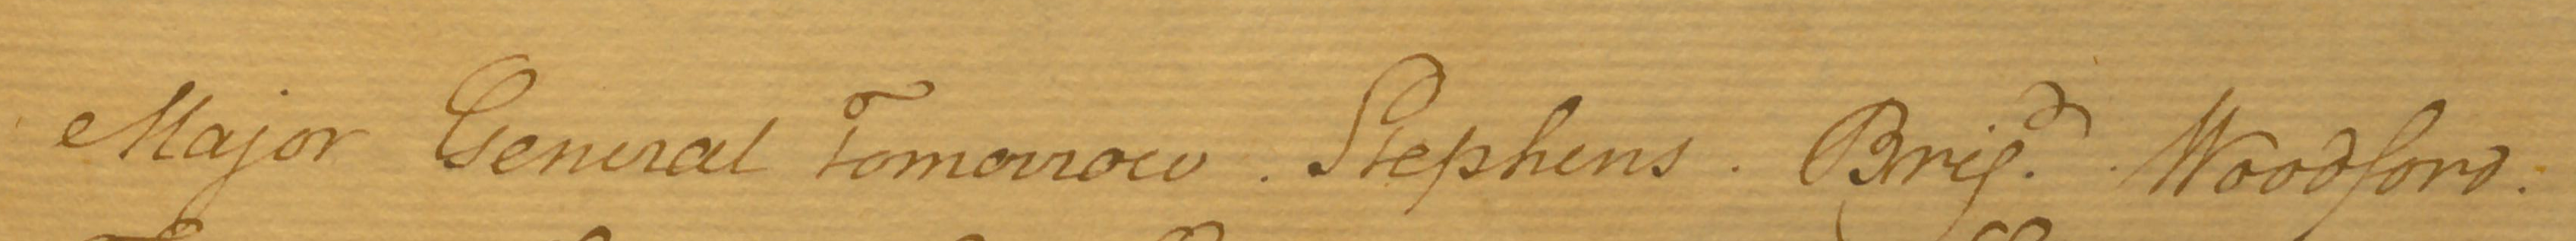Major General Tomorrow. Stephens. Brig^r. Woodford.
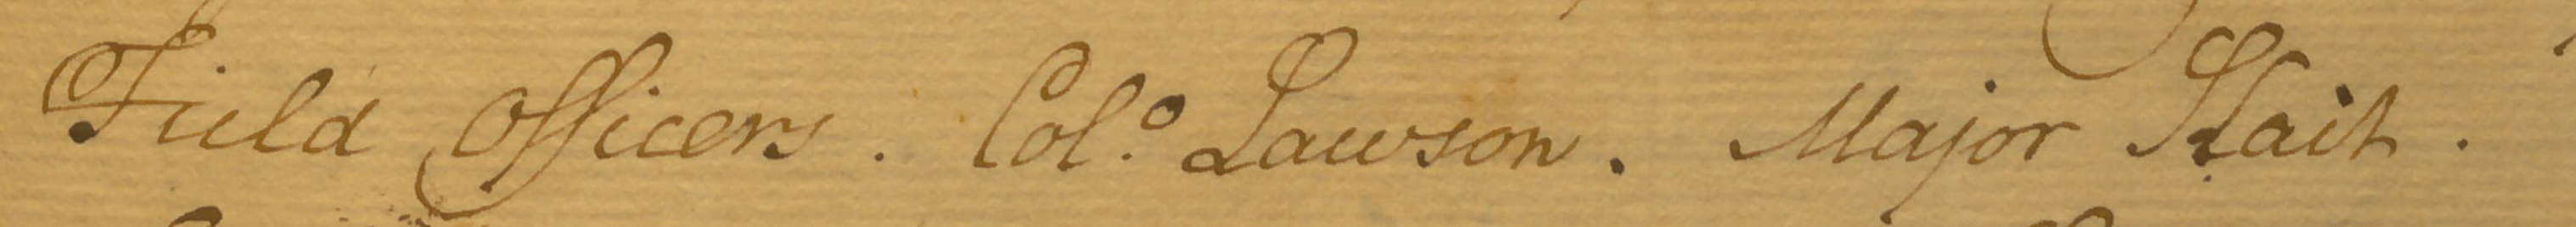Field officers. Col^o. Lawson. Major Slait.
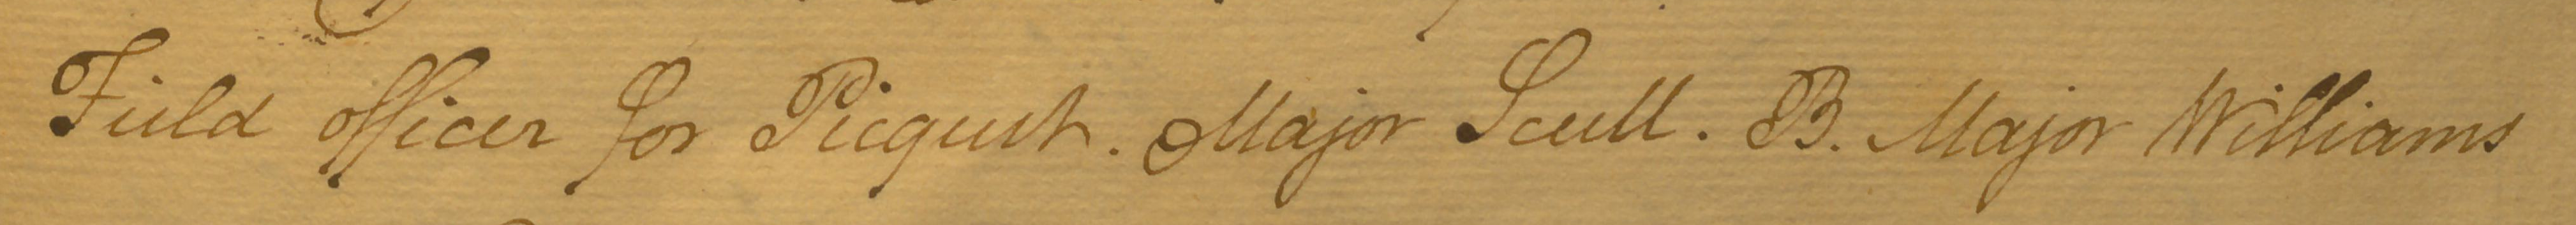Field officer for Picquet. Major Scull. B. Major Williams
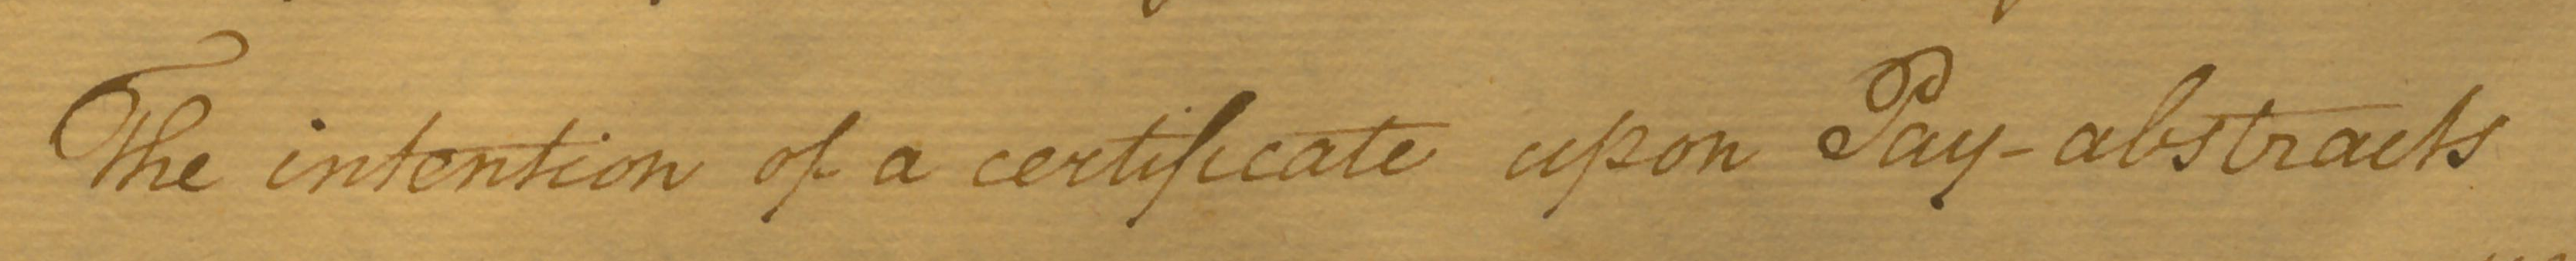The intention of a certificate upon Pay-abstracts
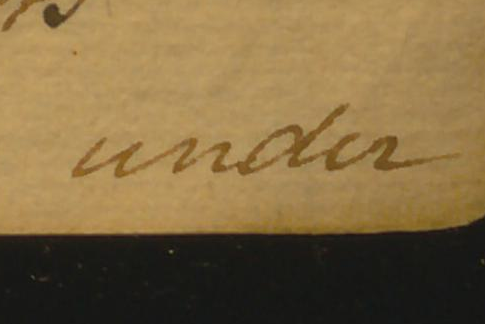under
